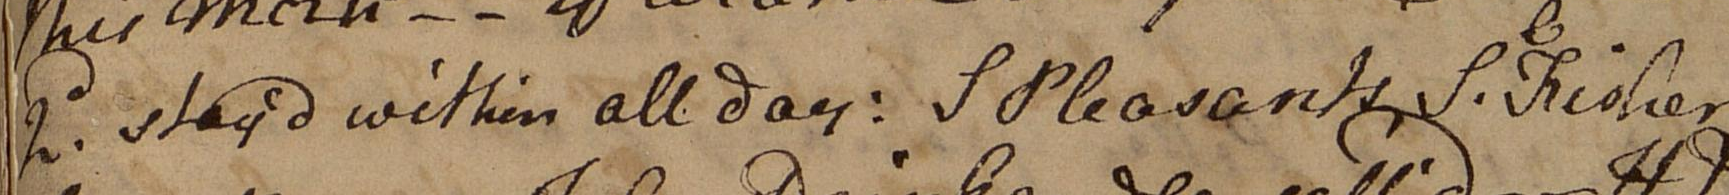2^d stay'd within all day: S Pleasants, S. ^l Fisher
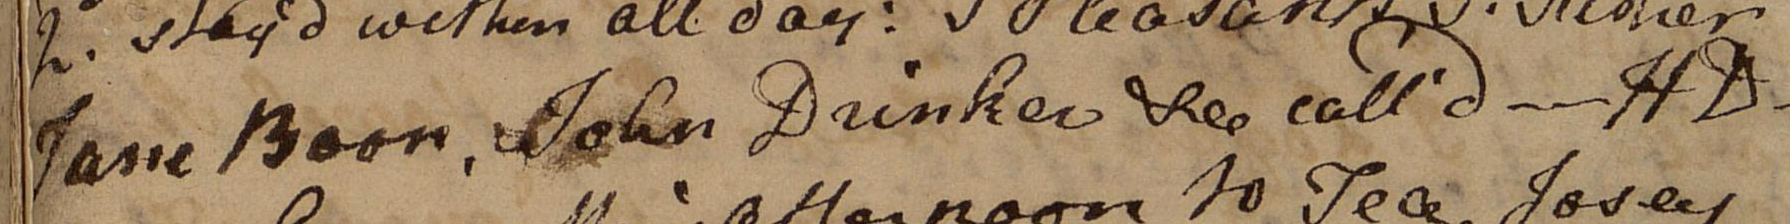Jane Boon, John Drinker &c call'd- HD
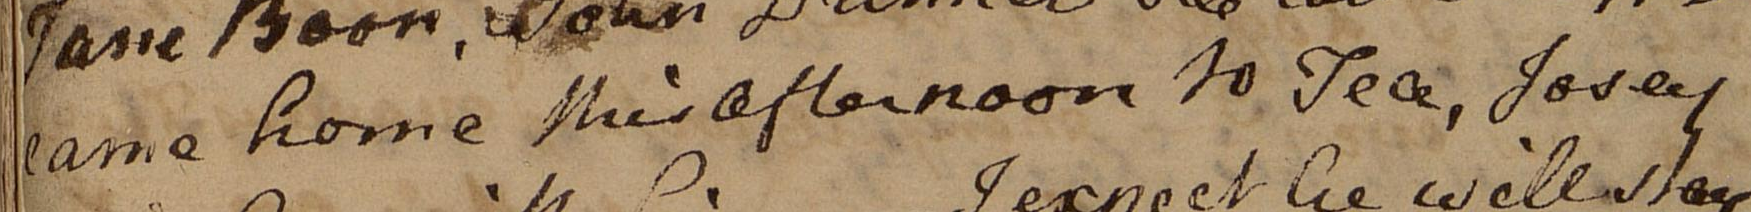came home this afternoon to Tea, Josey
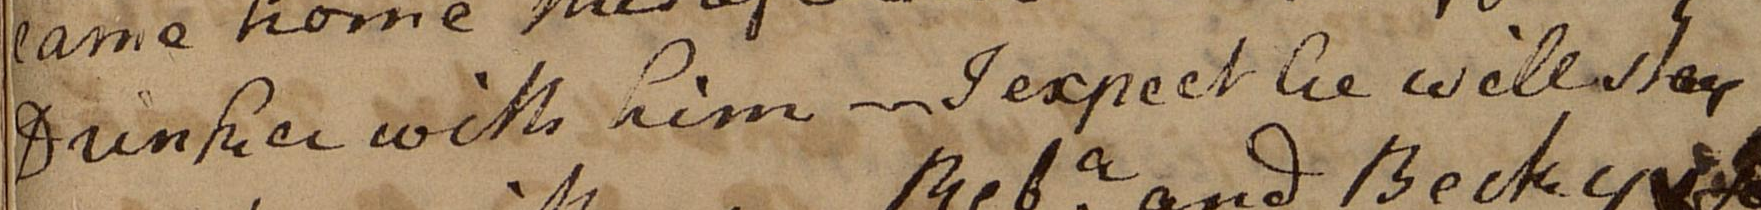Drinker with him- I expect he will stay
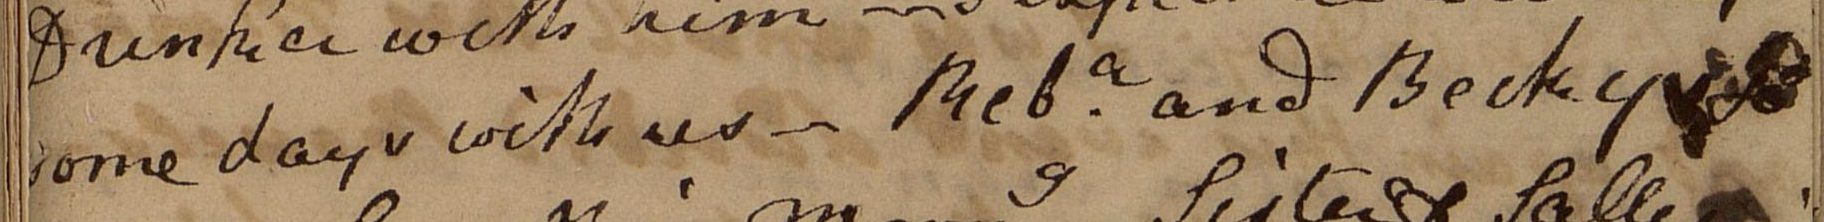some days with us- Reb^a. and Becky J
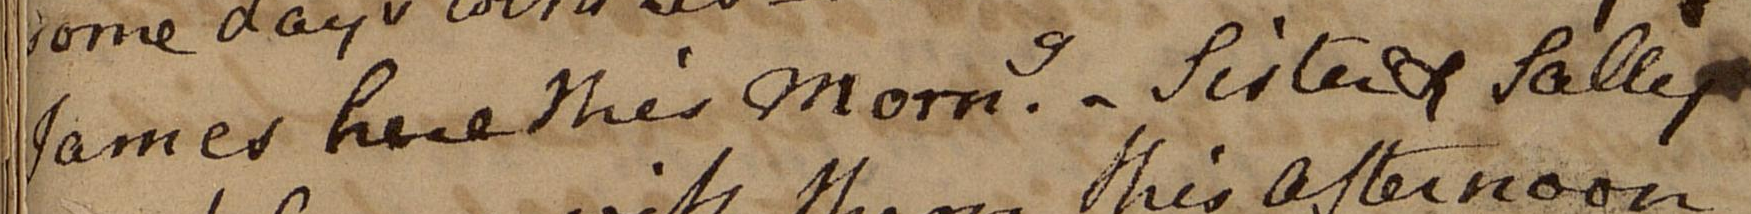James here this morn^g.- Sister & Sally
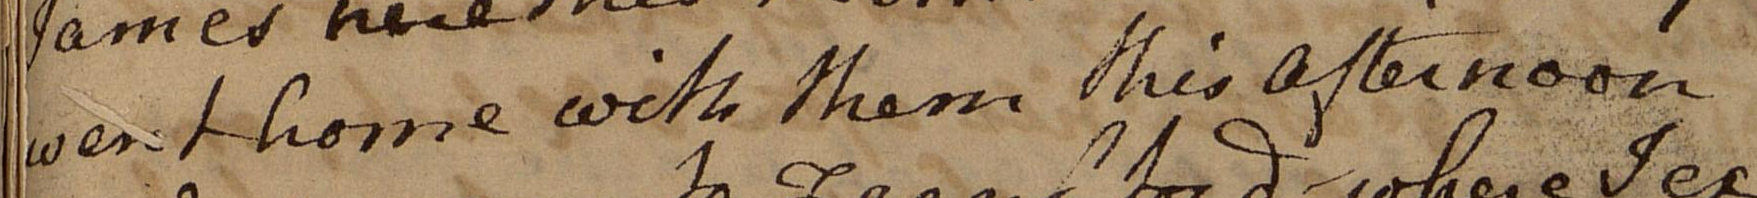went home with them this Afternoon
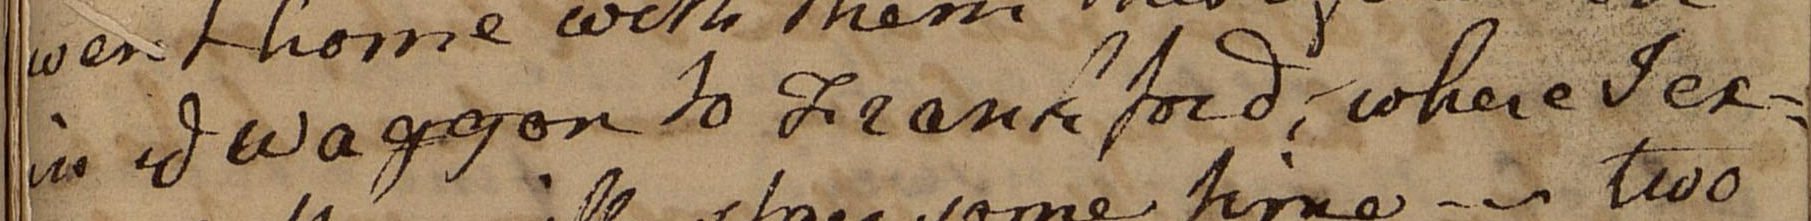in y^e waggon to Frank ford, where I ex-
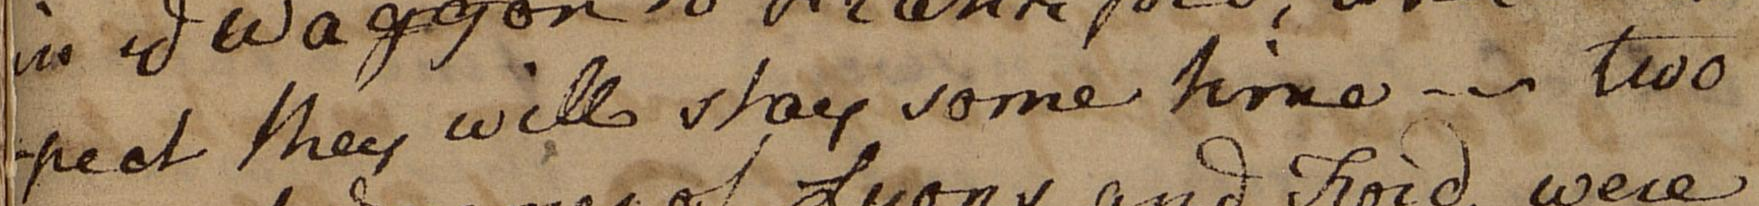pect they will stay some time-- two
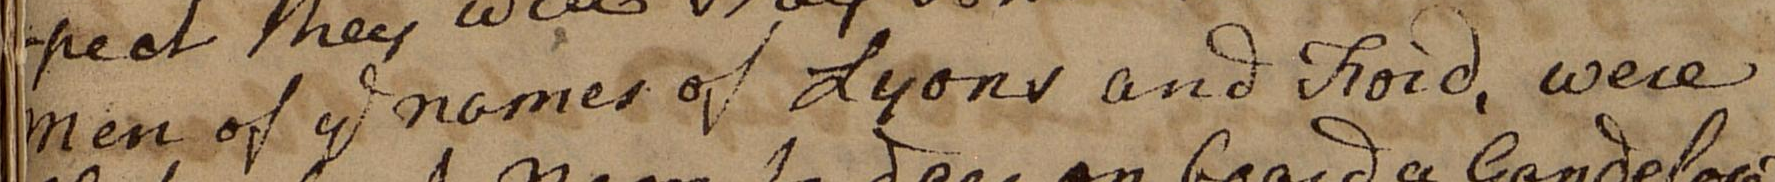nen of y^e names of Lyons and Ford, were
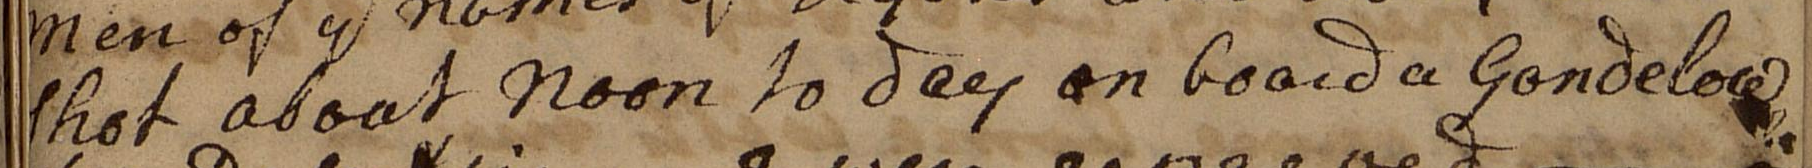shot about noon to day on board a Gondelow,
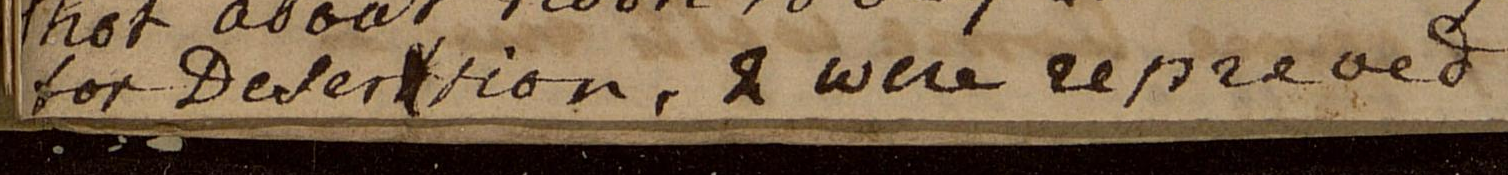for Desertsion, 2 were repreved
